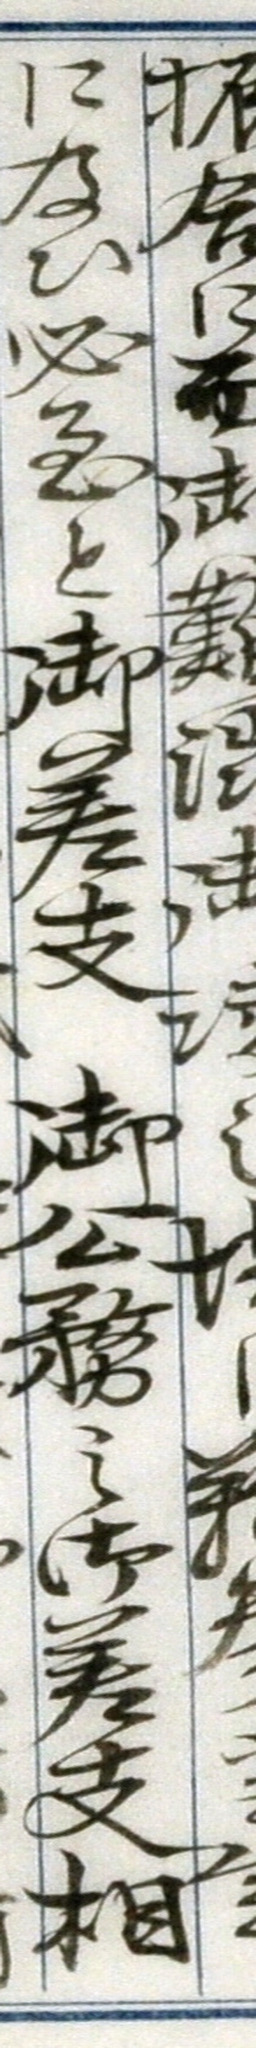に及ひ必至と御差支御公務之御差支相
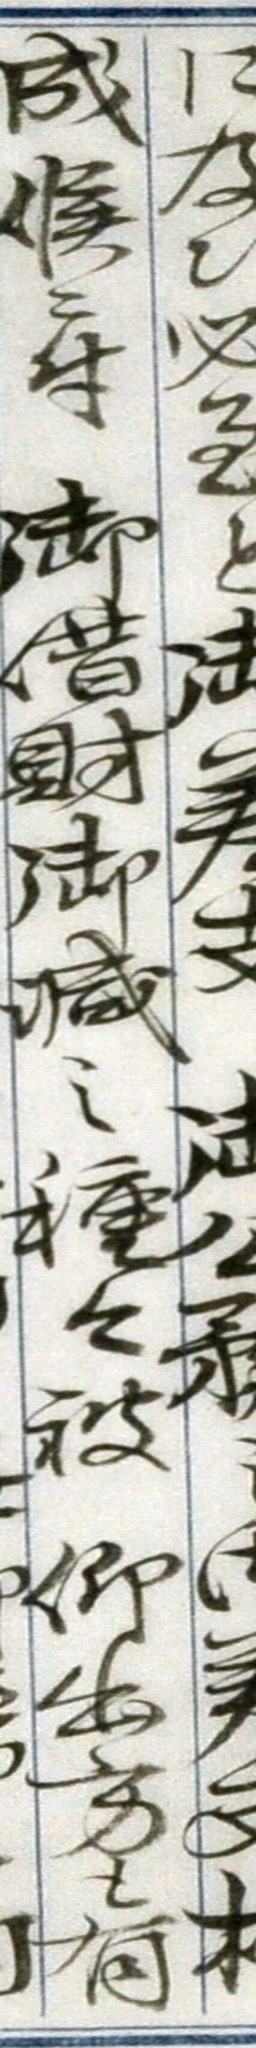成候ニ付御借財御減之種々被仰出方も有
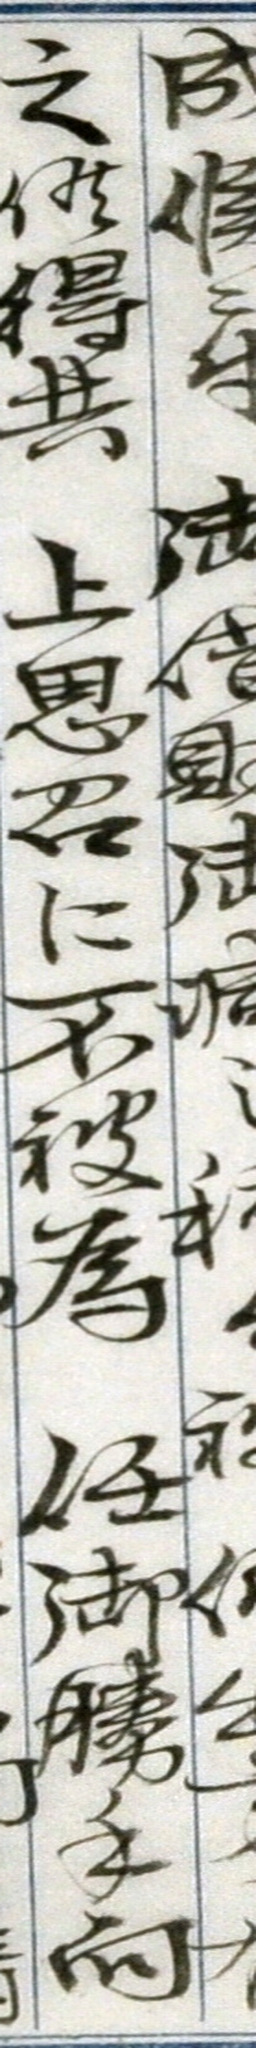之候得共上思召に不被為任御勝手向
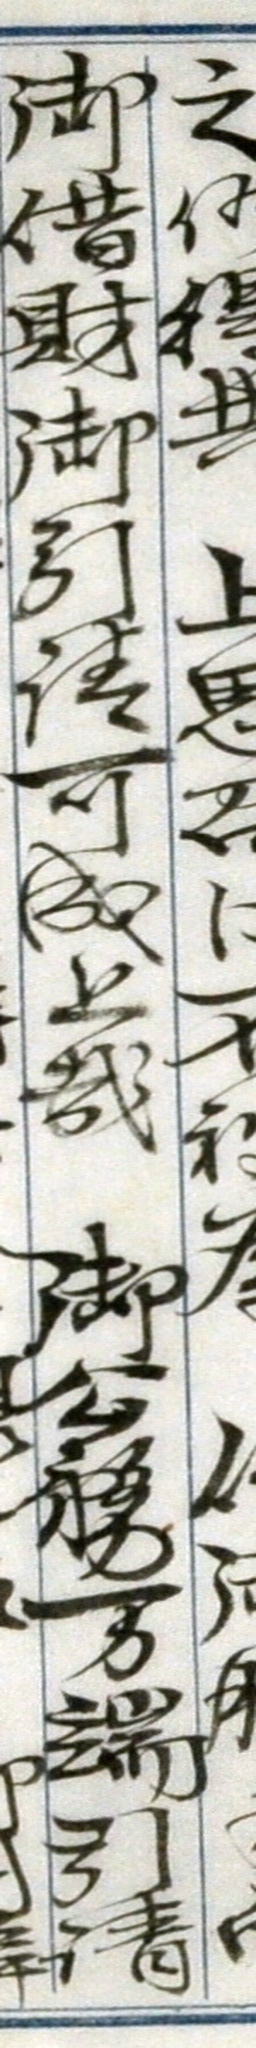御借財御引請可成上哉御公務万端引請
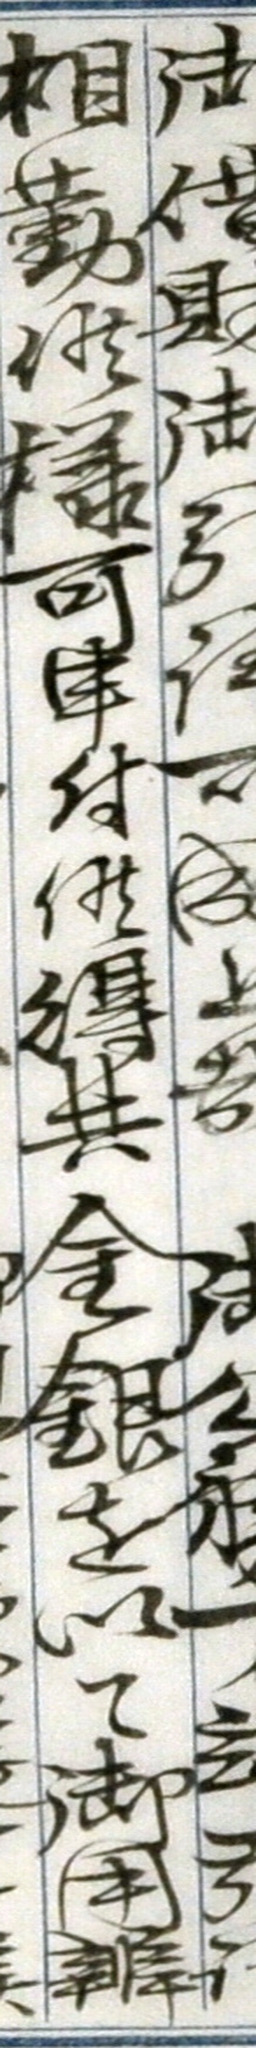相勤候様可申付候得共金銀を以て御用弁
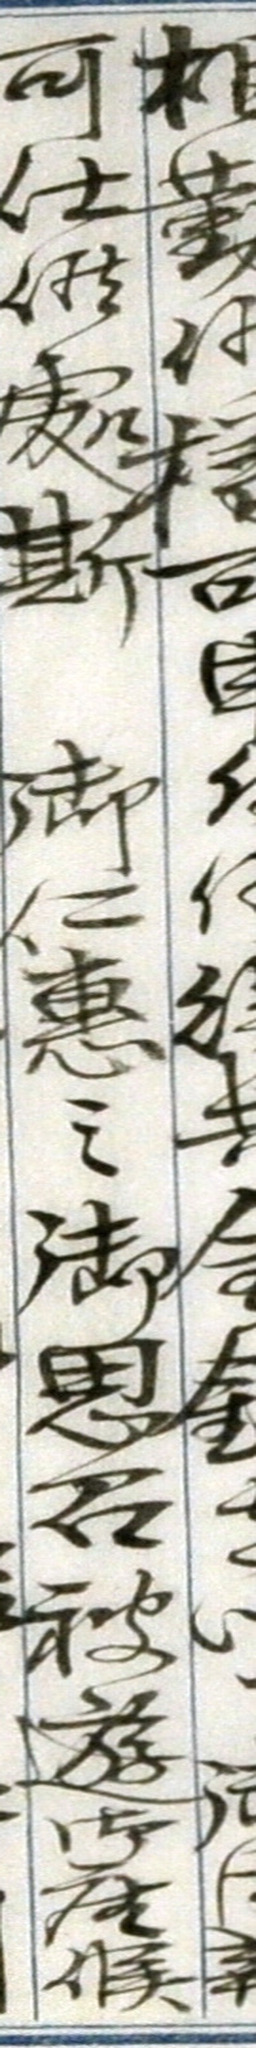可仕候処斯御仁恵之御思召被遊御座候
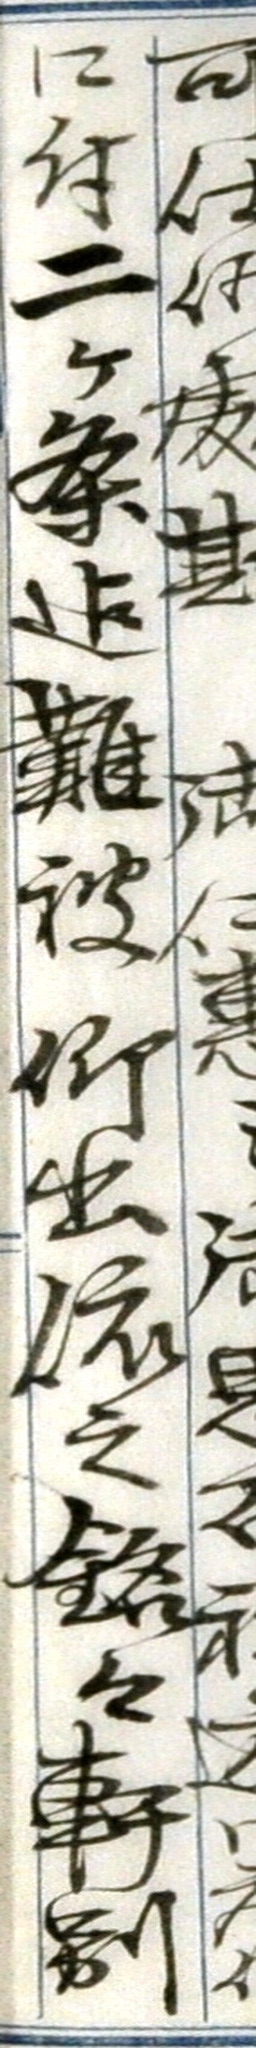に付二ヶ条迄難被仰出依之銘々軒別

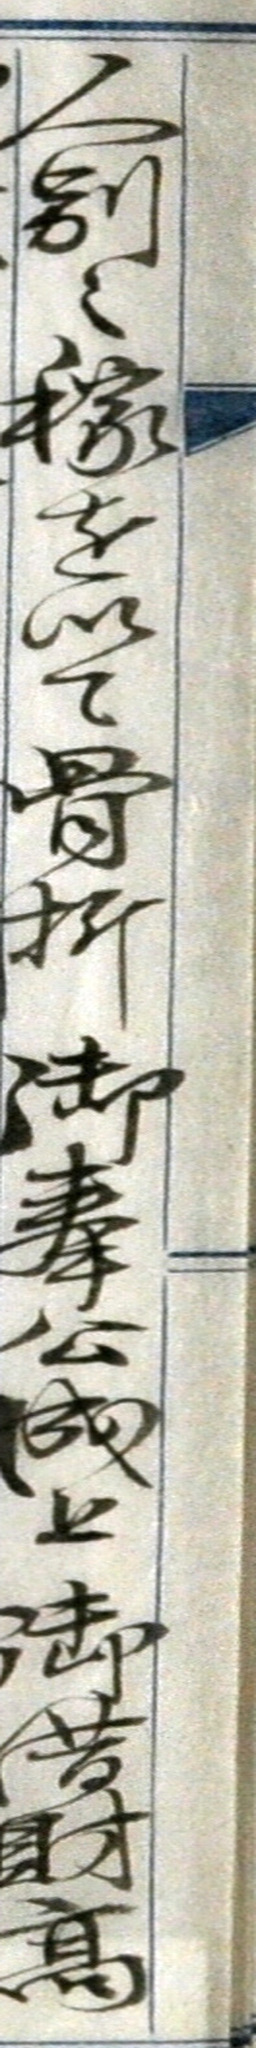人別之稼を以て骨折御奉公成上御借財高
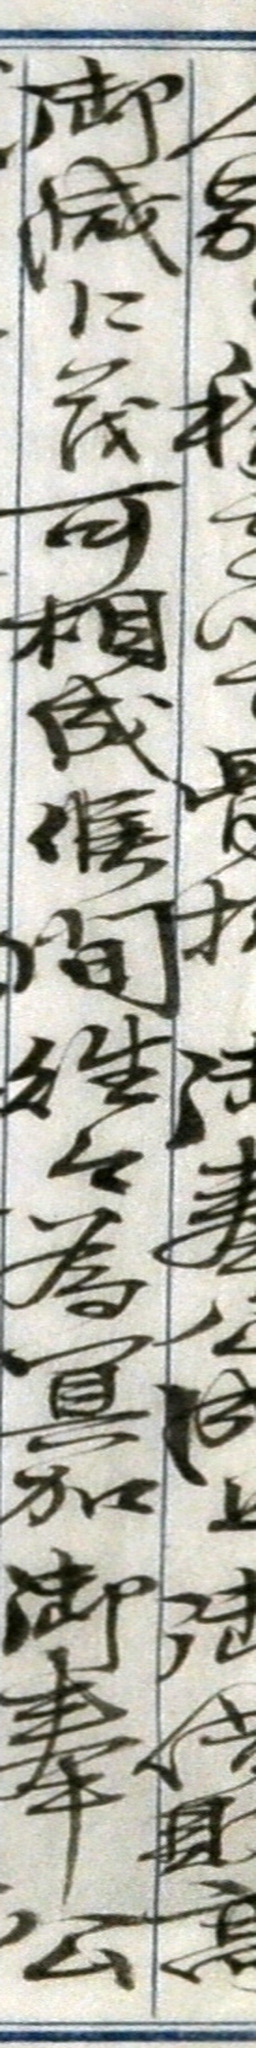御減に茂可相成候間往々為冥加御奉公
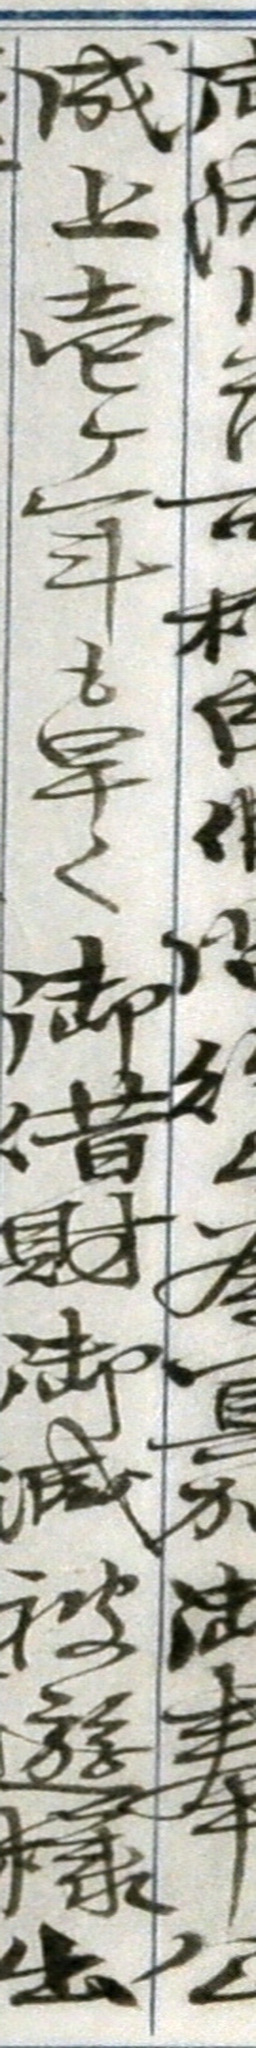成上壱ヶ年も早く御借財御減被遊様出
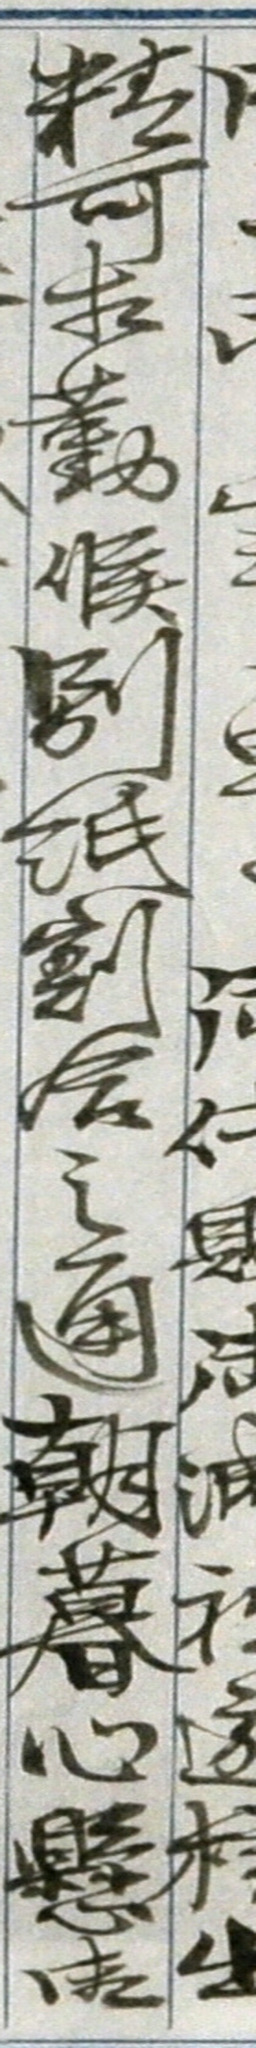精可相勤候別紙割合之通朝暮心懸御
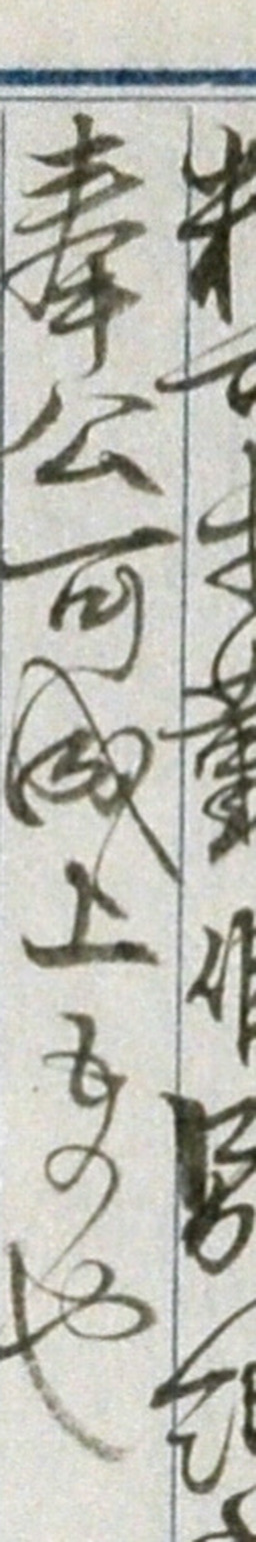奉公可成上もの也
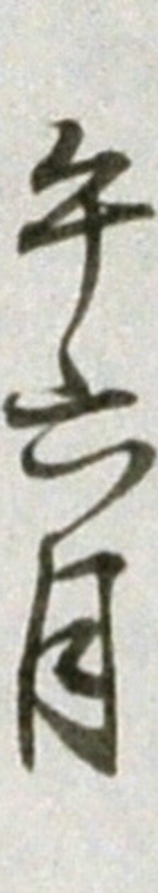午六月
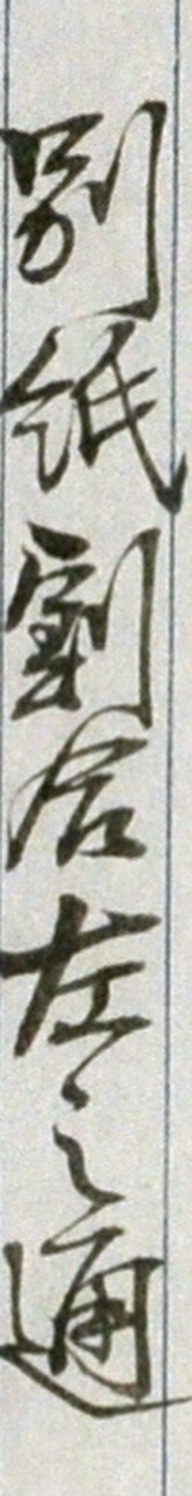別紙割合左之通
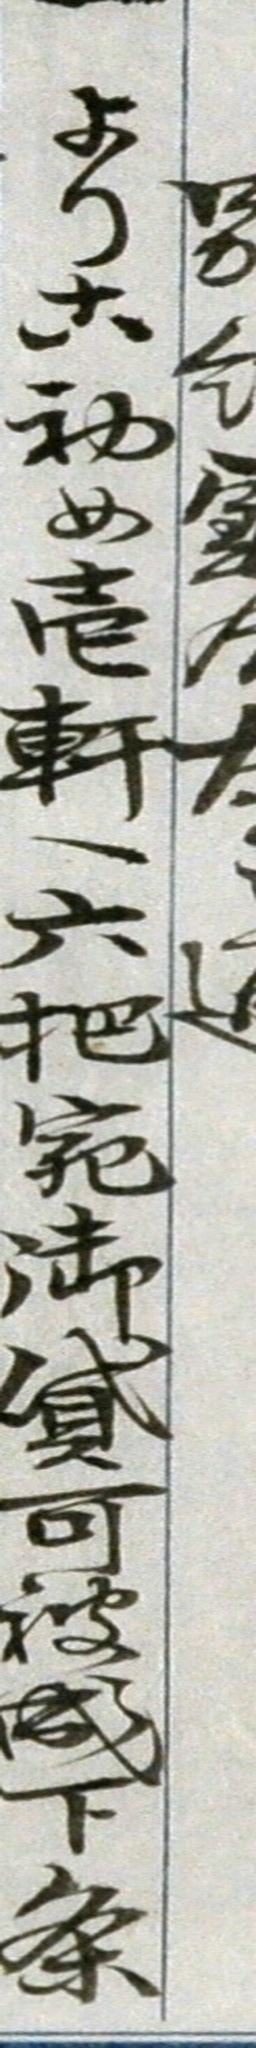一より古初め壱軒へ六把宛御貸可被成下条
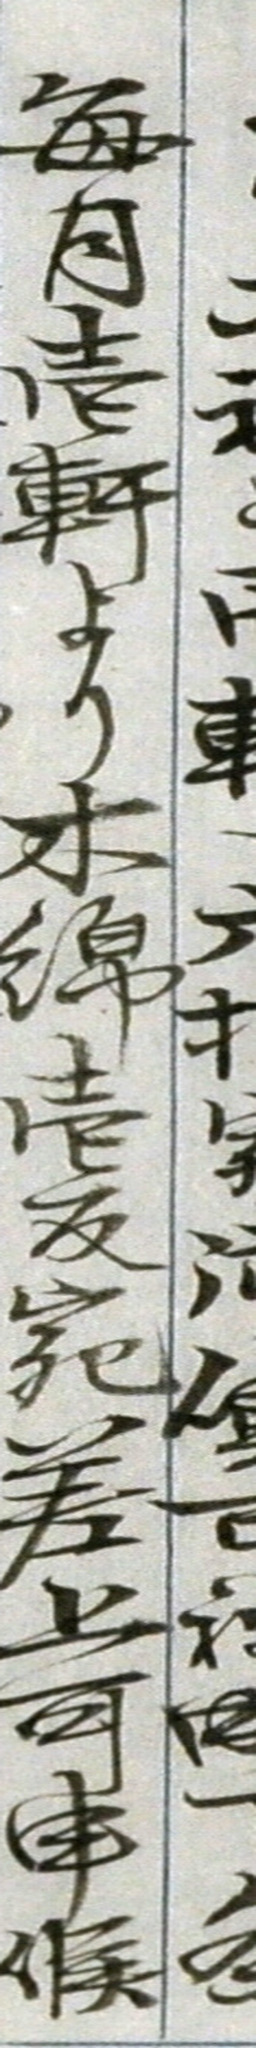毎月壱軒より木綿壱反宛差上可申候
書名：倹約筋御沙汰書
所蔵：伊那市立高遠町図書館・合同会社AMANE
